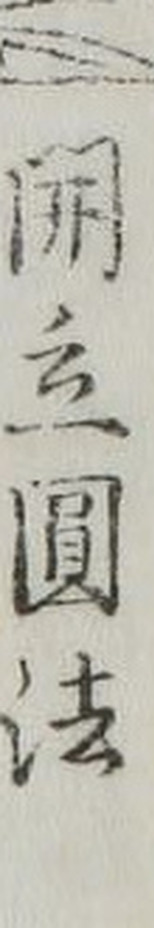開立円法
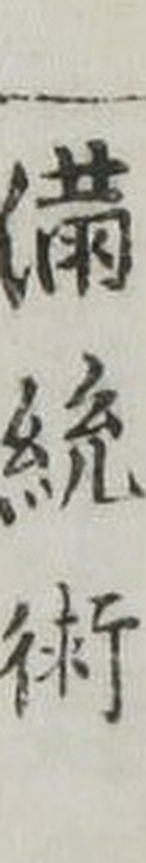満統術
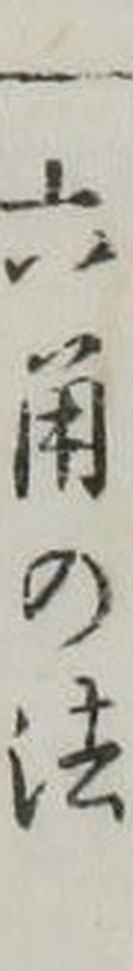六角の法
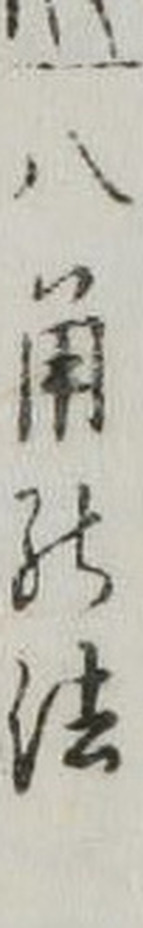八角の法
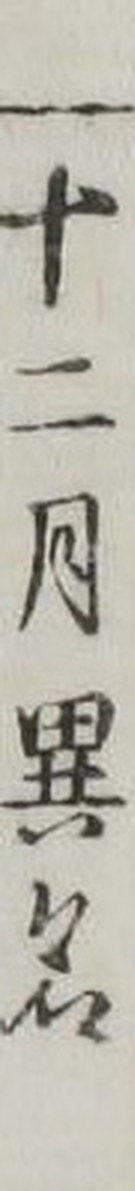十二月異名
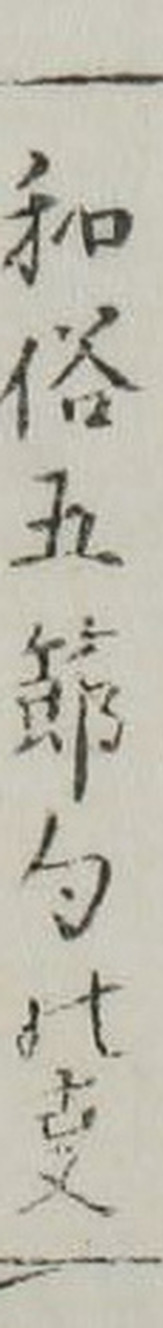和俗五節句の事
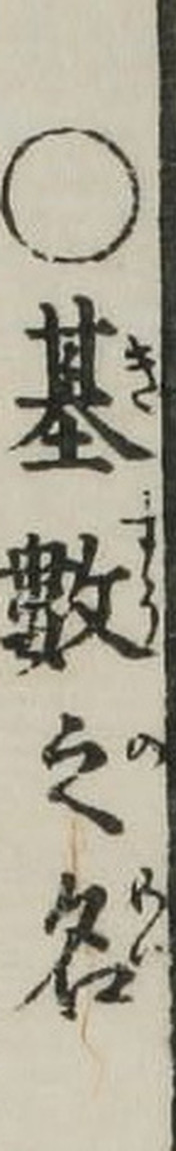○基数之名
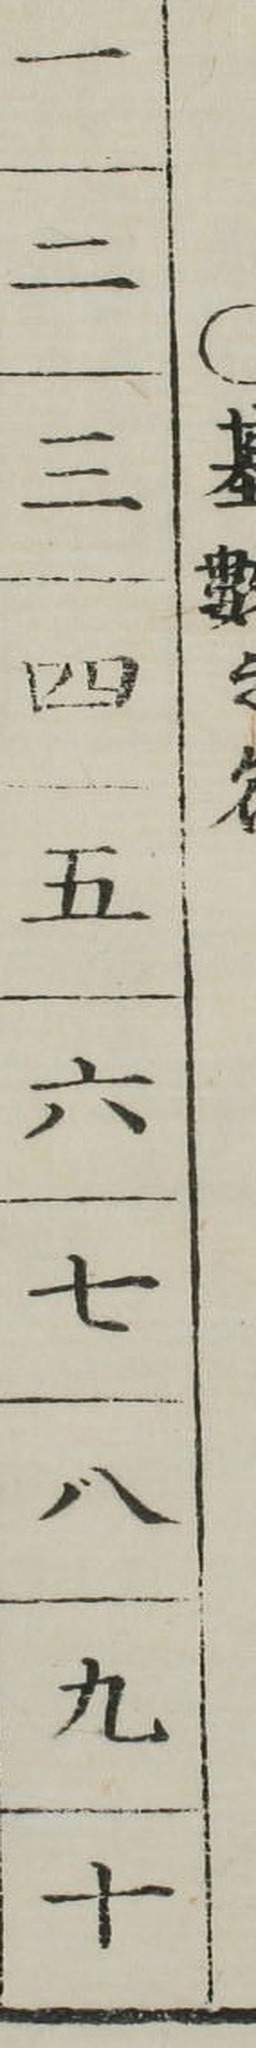一二三四五六七八九十
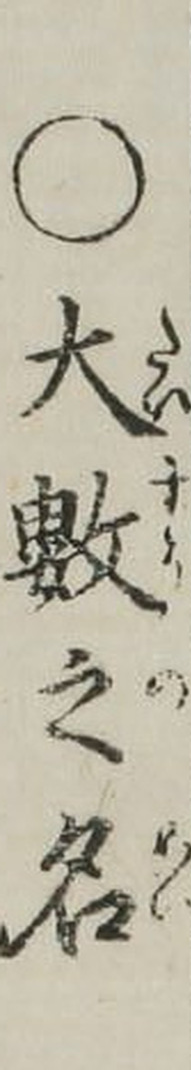○大数之名
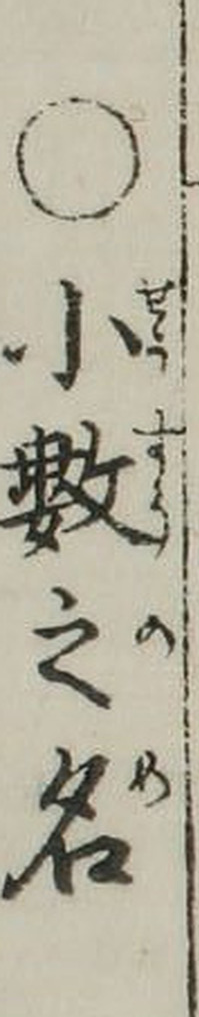○小数之名
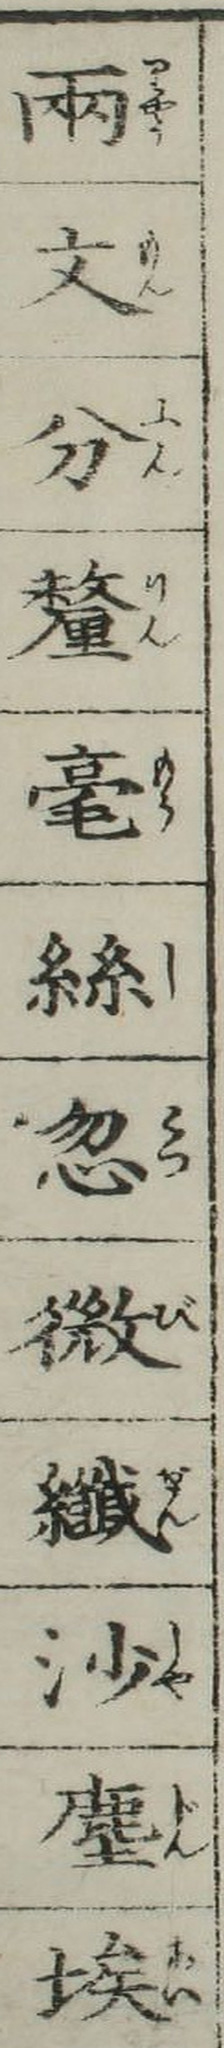両文分釐毫糸忽微繊沙塵埃

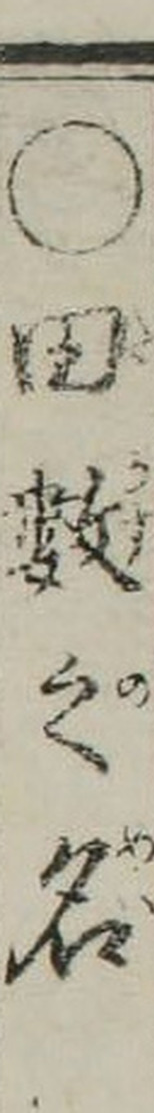○田数之名
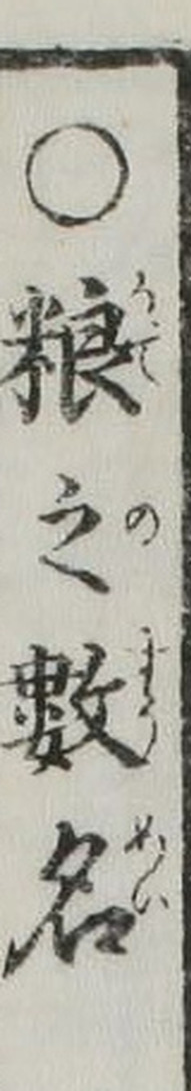○粮之数名

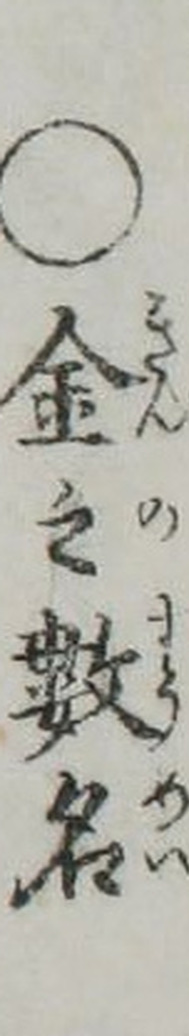○金之数名
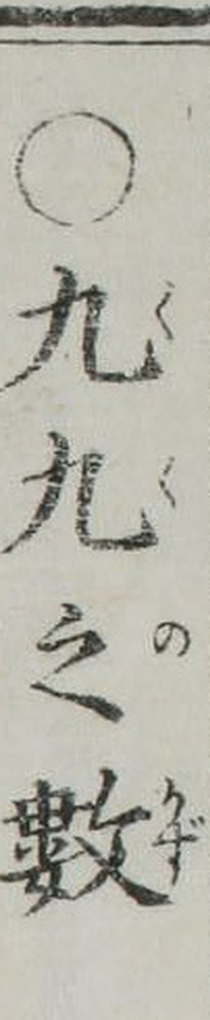○九九之数
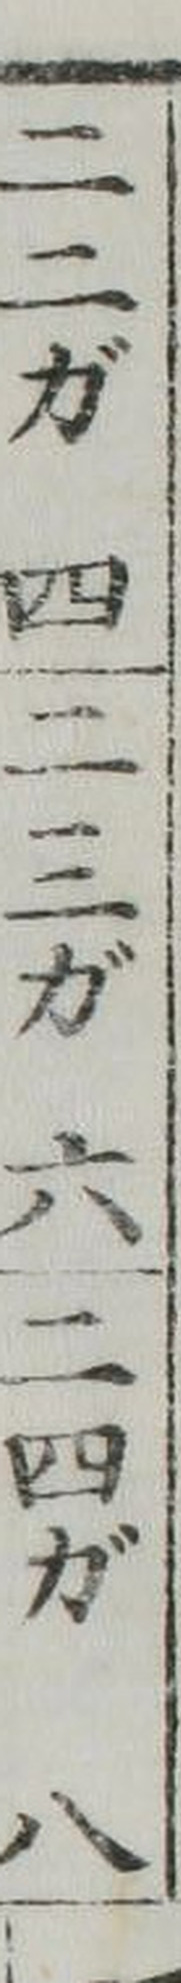二二ガ四二三ガ六二四ガ八
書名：宝玉塵劫記
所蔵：東京学芸大学教育コンテンツアーカイブ
